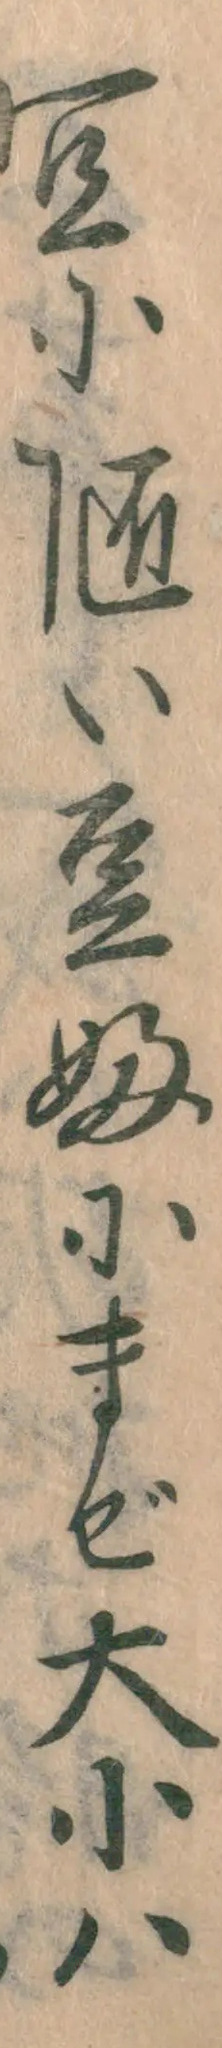宜に随い豆ふにまぜ大小は
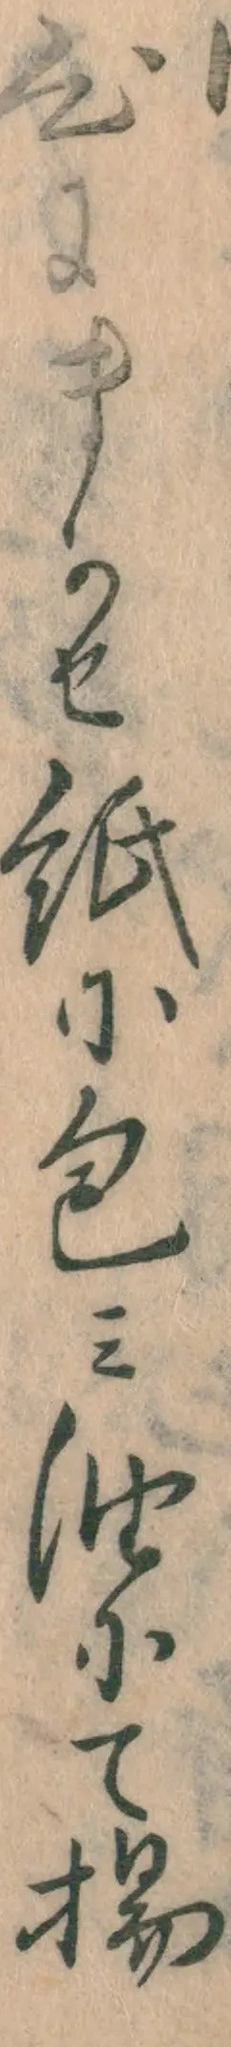心にまかせ紙に包み油にて揚
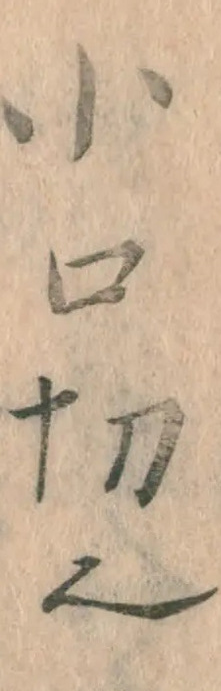小口切也
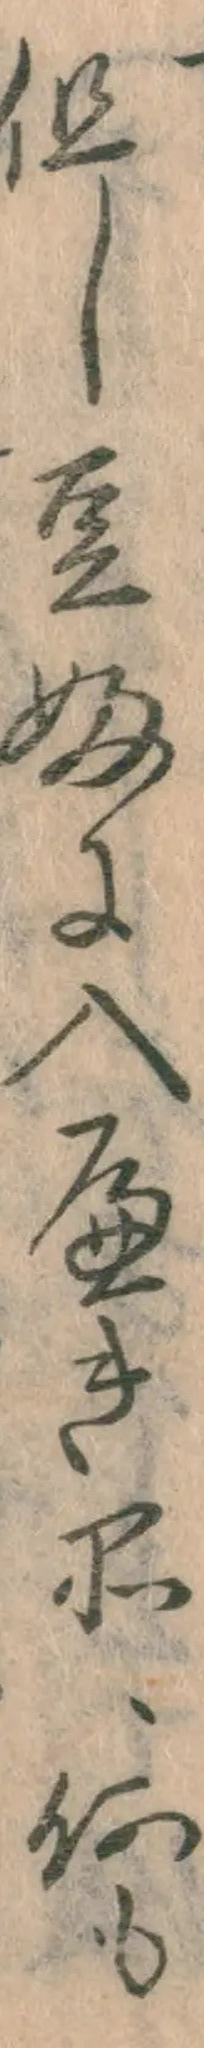但し豆ふに入へき品は何も
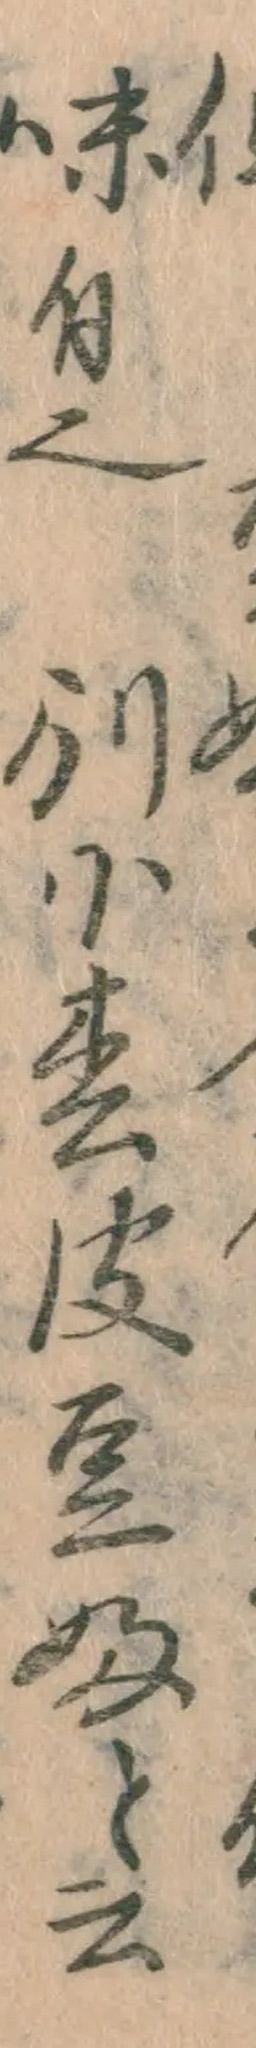味付也別に松皮豆ふと云
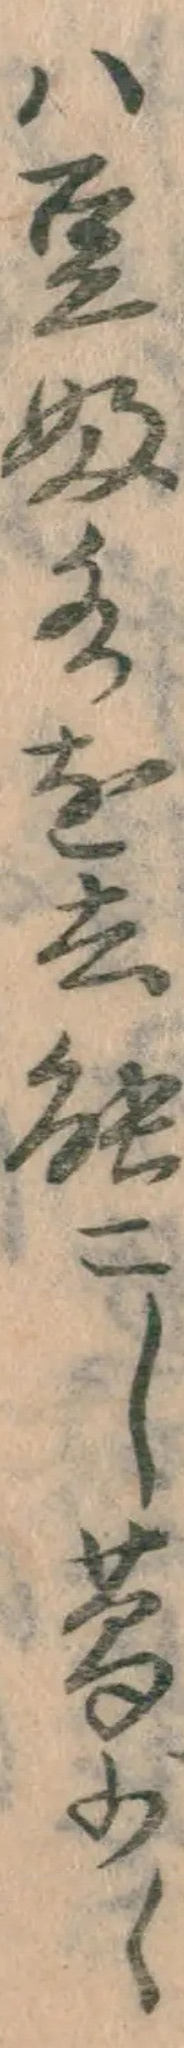は豆ふ水を去能こし葛少し
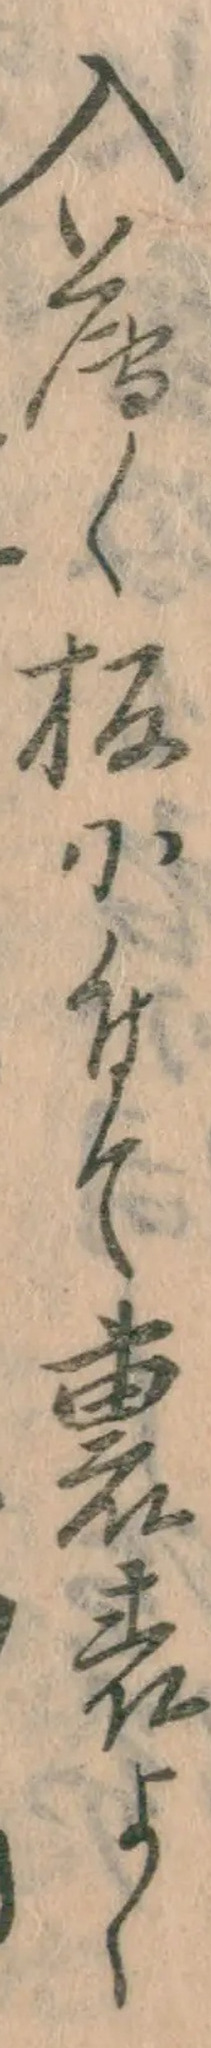入薄く板に付て裏表よく
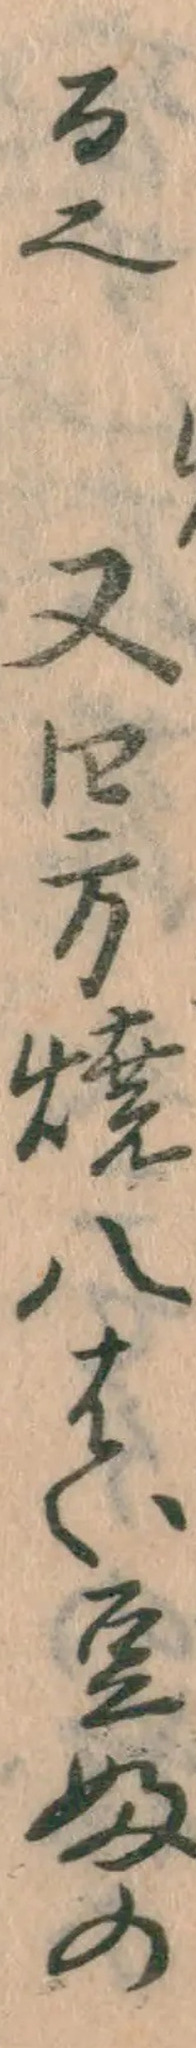る也又四方焼八はい豆ふの
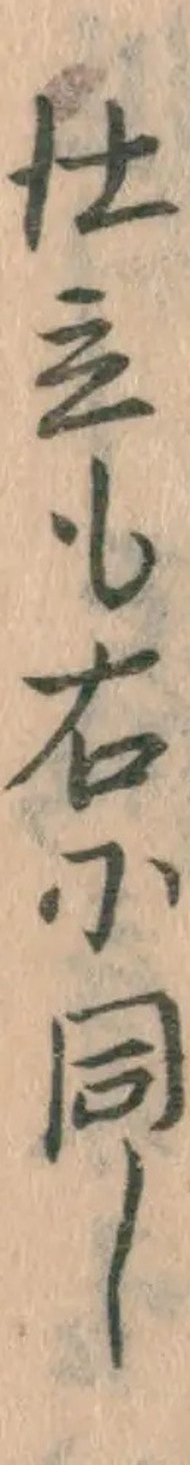仕立も右に同し
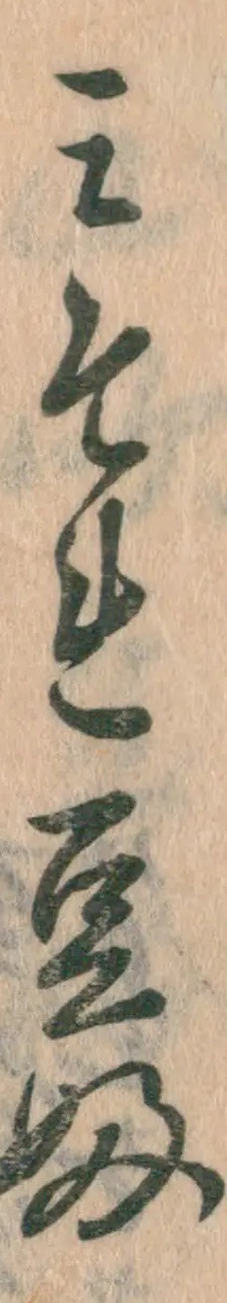みそれ豆ふ
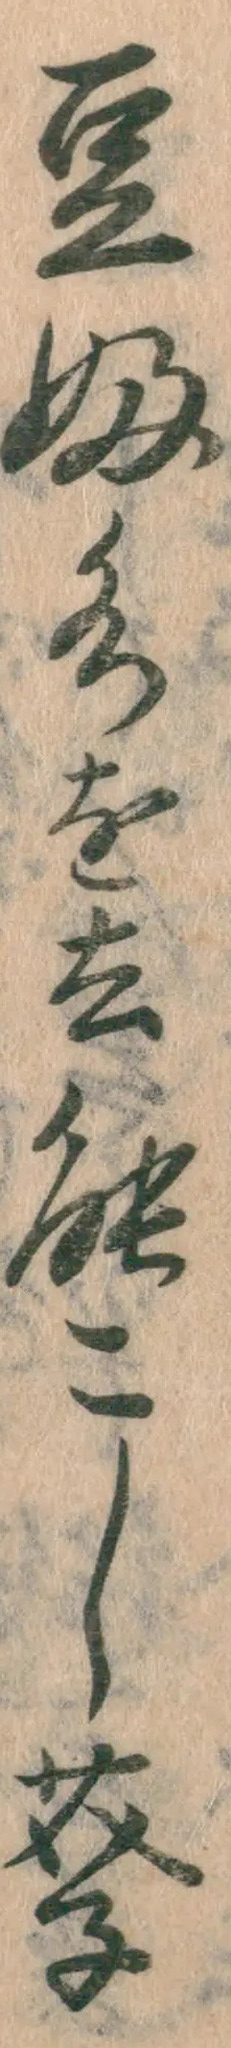豆ふ水を去能こし芥子
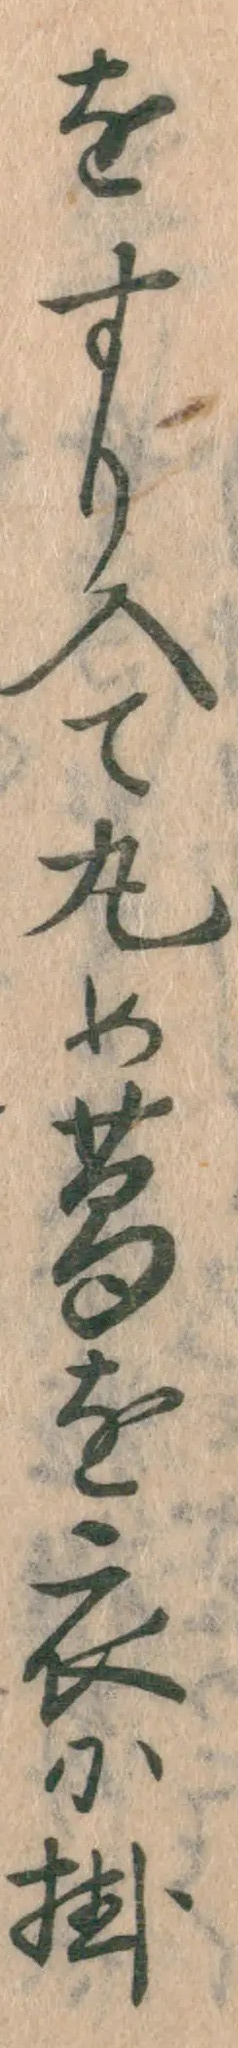をすり入て丸め葛を衣に掛
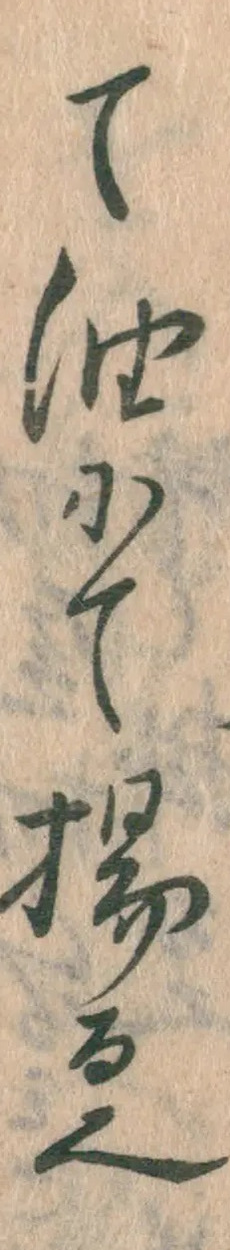て油にて揚る也
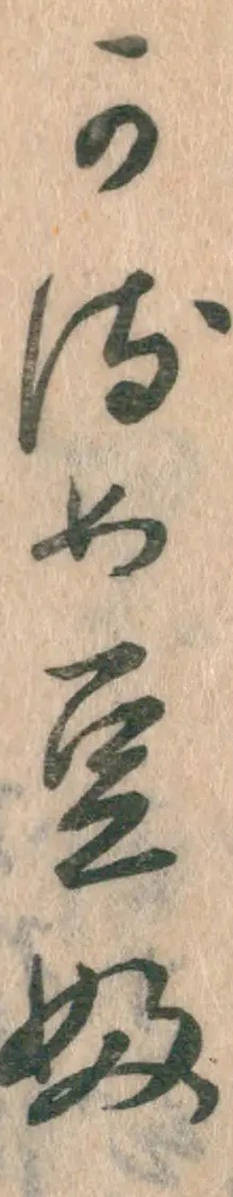かるめ豆ふ
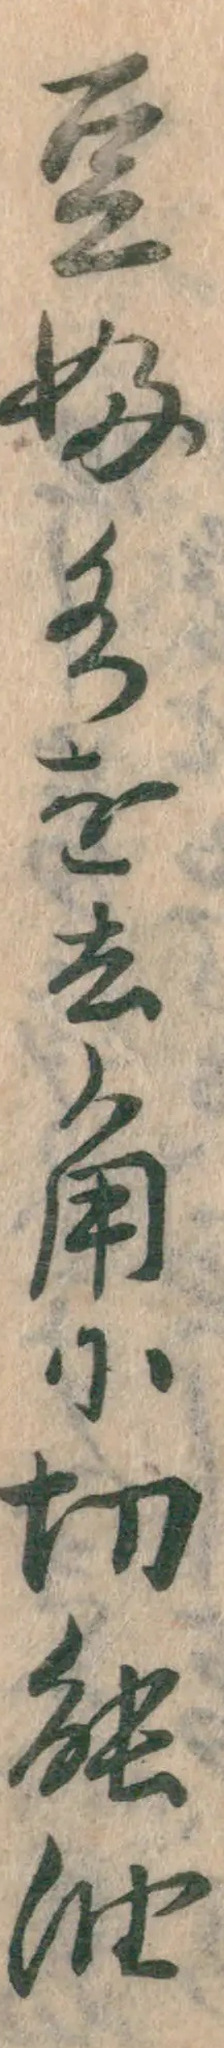豆ふ水を去角に切能油
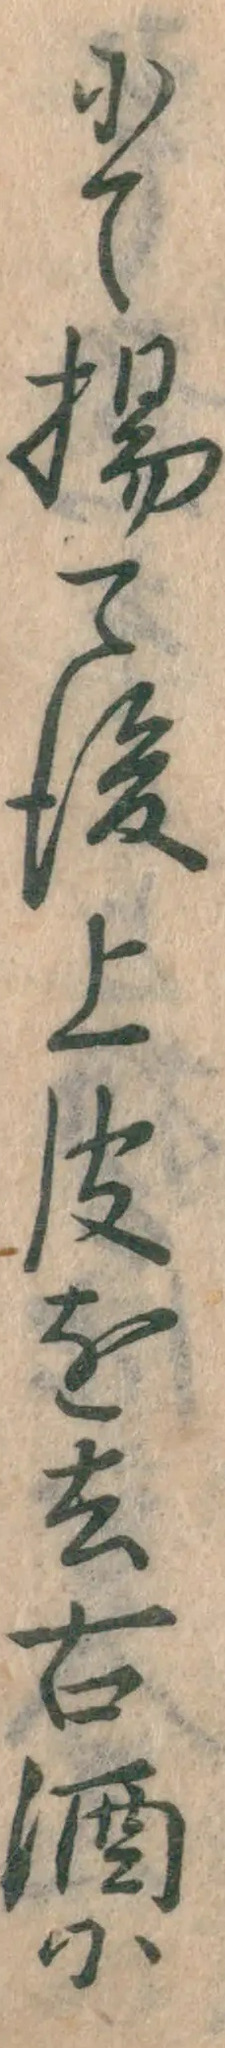にて揚て後上皮を去古酒に
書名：豆腐百珍余録
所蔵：国立国会図書館 National Diet Library, JAPAN
